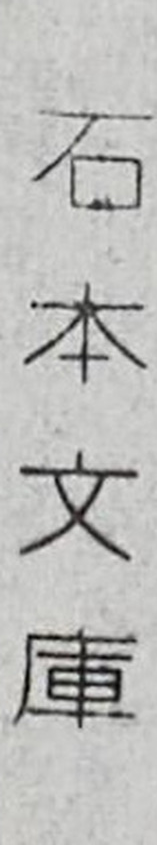石本文庫-
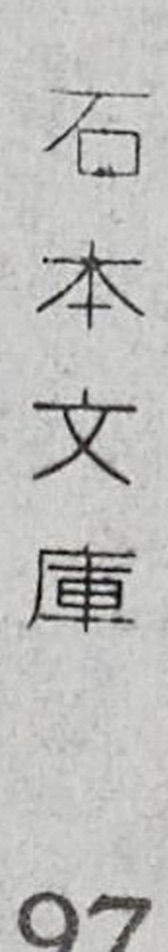石本文庫-
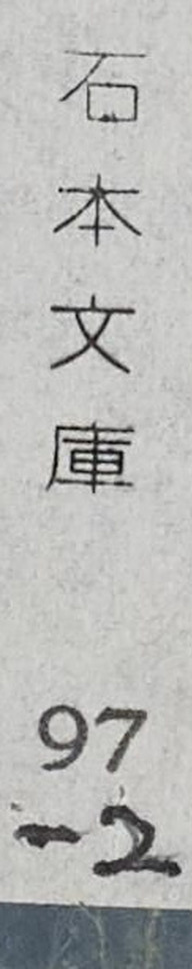石本文庫-
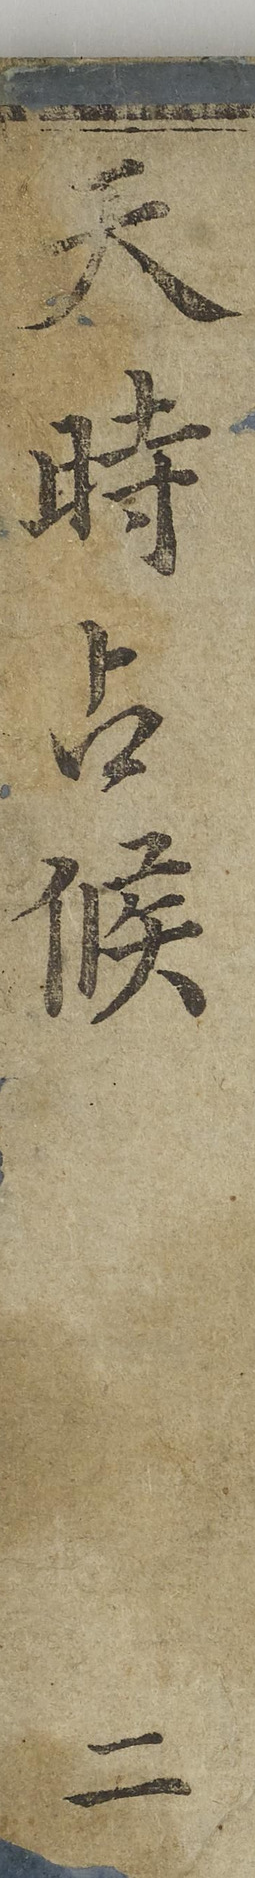天時占候二

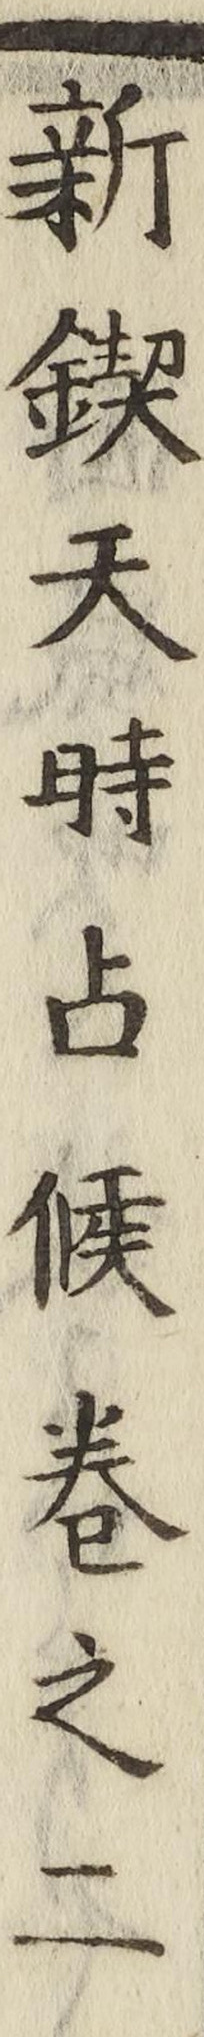新鍥天時占候巻之二
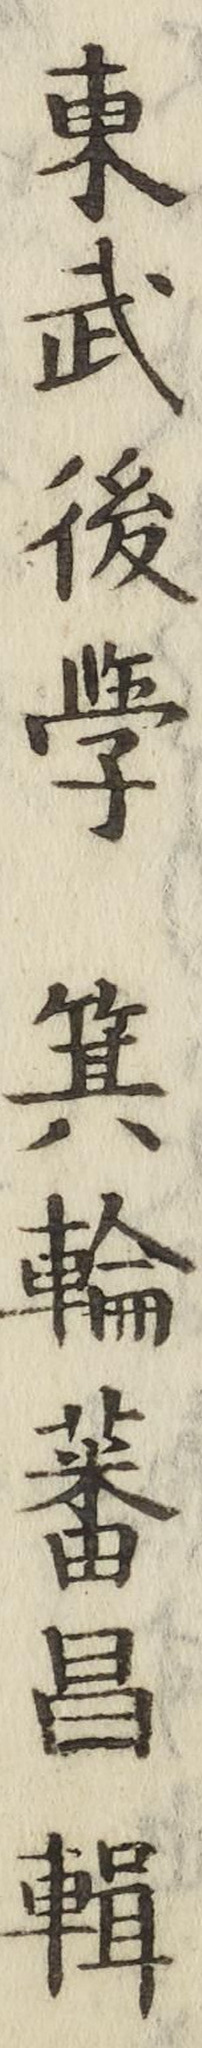東武後学箕輪蕃昌輯
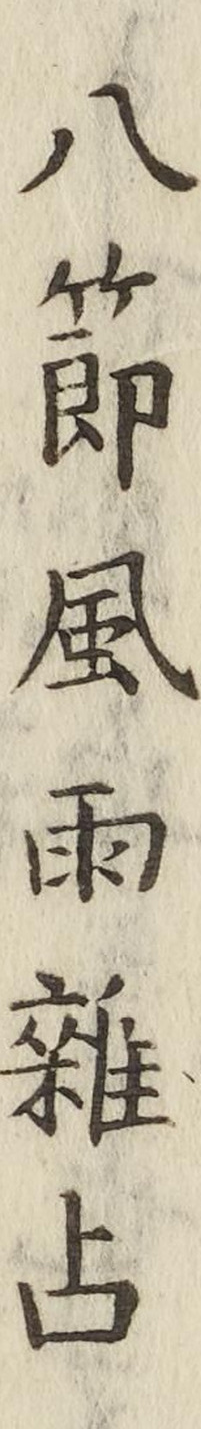八節風雨雑占
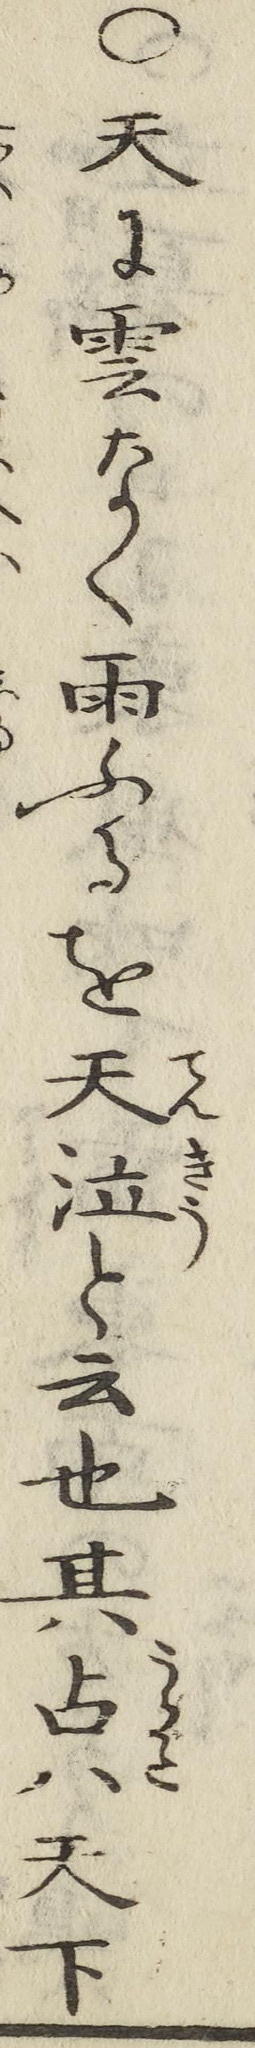〇天に雲なく雨ふるを天泣と云也其占は天下
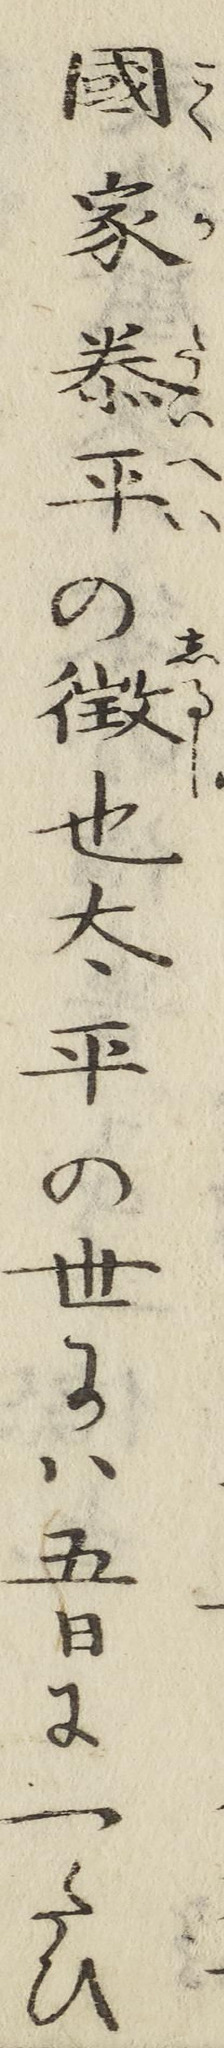国家泰平の徴也太平の世には五日に一たひ
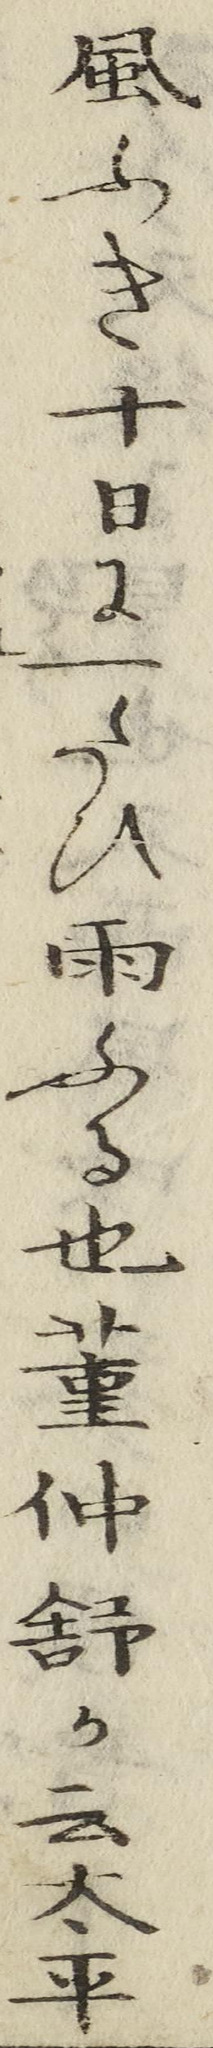風ふき十日に一たひ雨ふる也董仲舒か云太平
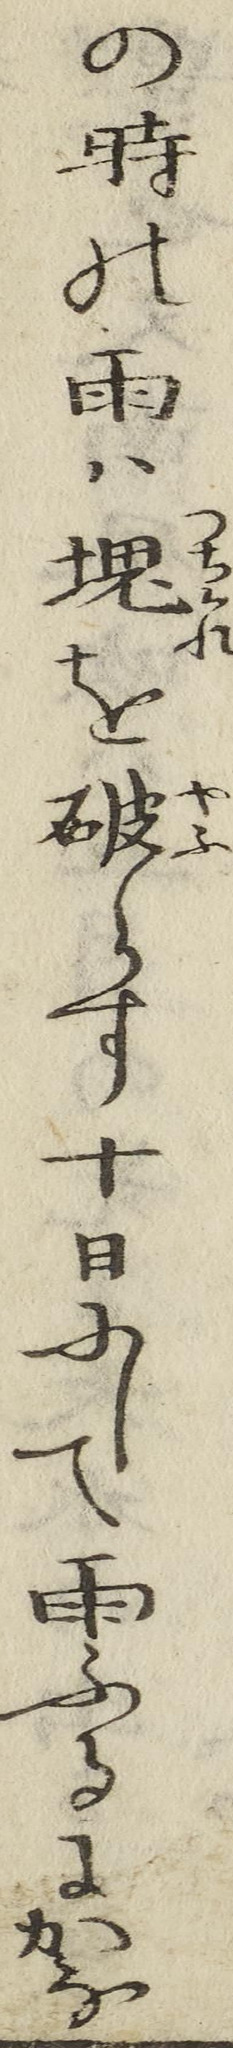の時の雨は塊を破らす十日にして雨ふるにかな
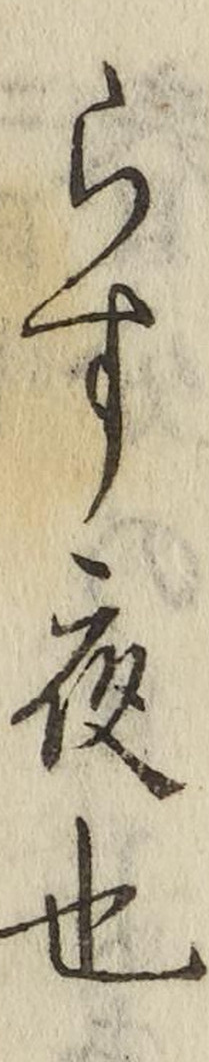らす夜也

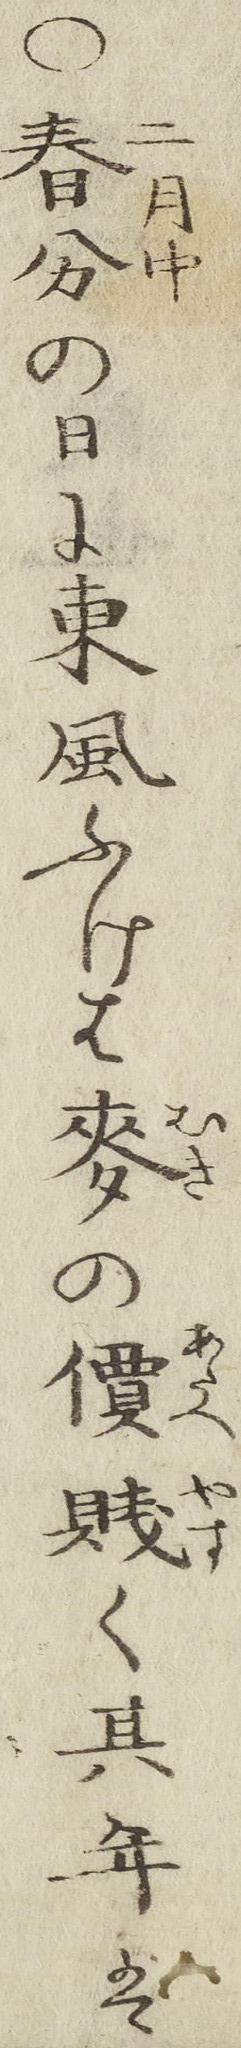〇春分の日に東風ふけは麦の価賤く其年は
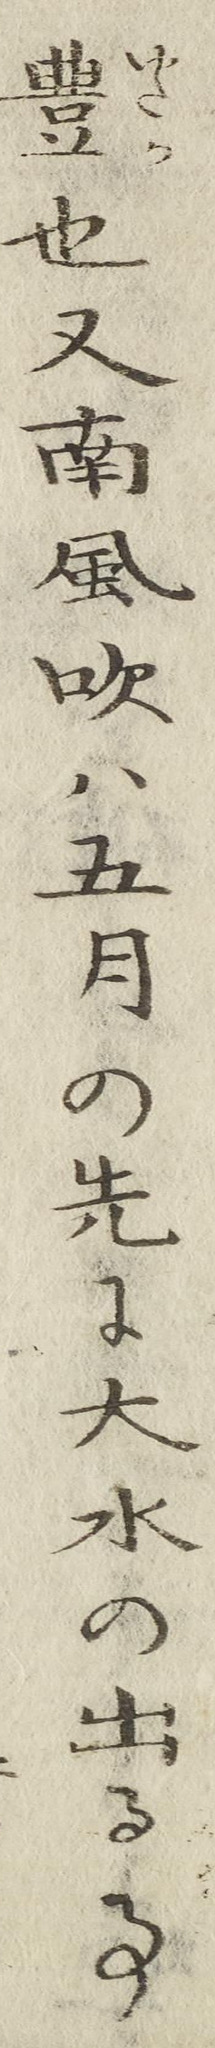豊也又南風吹は五月の先に大水の出る事
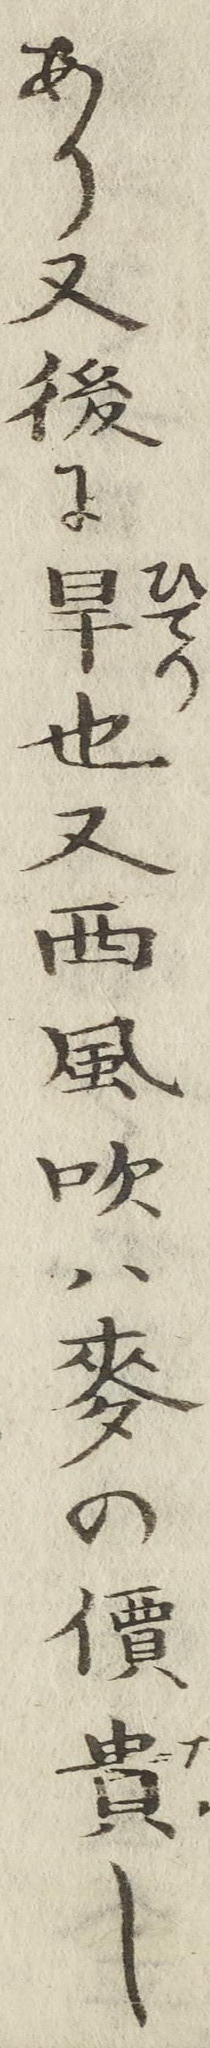あり又後に旱也又西風吹は麦の価貴し
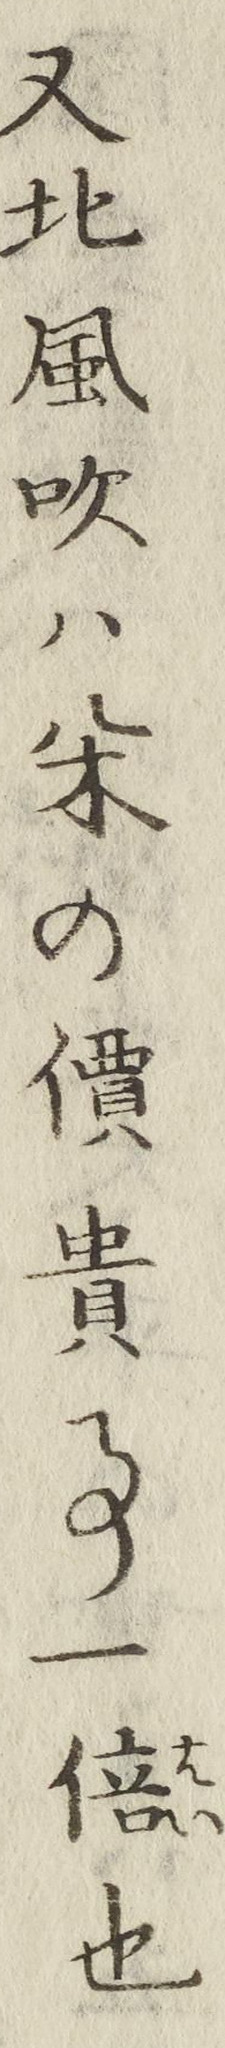又北風吹は米の価貴事一倍也
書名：天時占候　二
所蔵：東京大学地震研究所図書室 Earthquake Research Institute Library, The University of Tokyo, JAPAN
